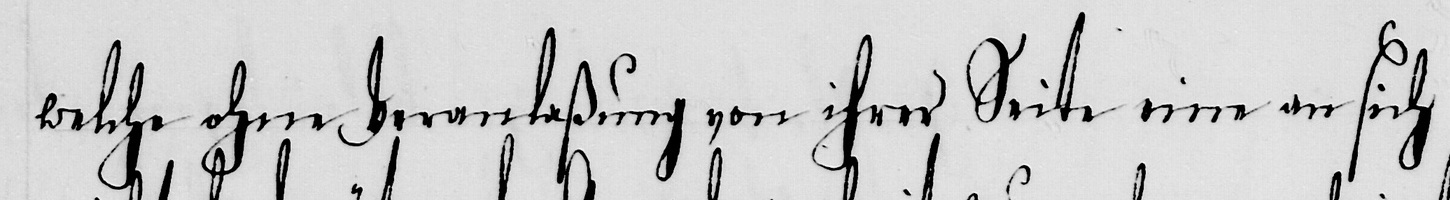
welche ohne Veranlaßung von ihrer Seite eine an sich
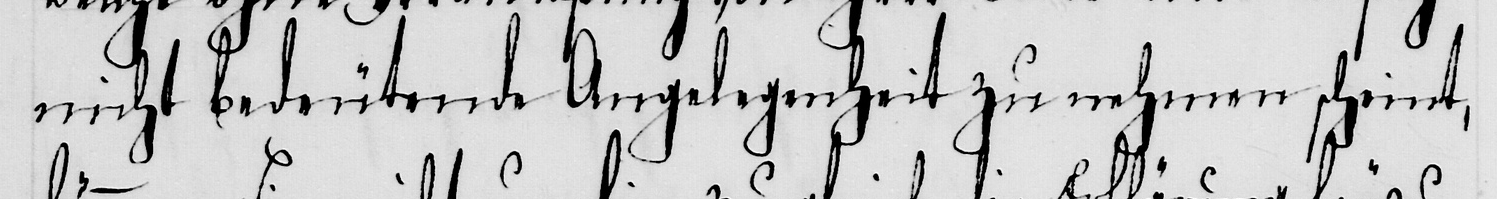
nicht bedeutende Angelegenheit zu nehmen scheint,
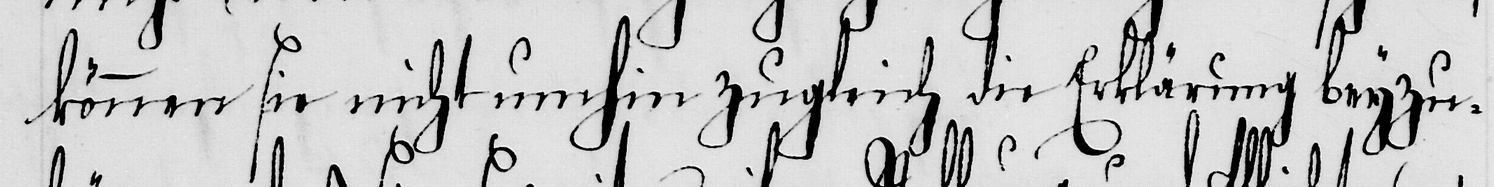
können sie nicht umhin zugleich die Erklärung beyzu¬
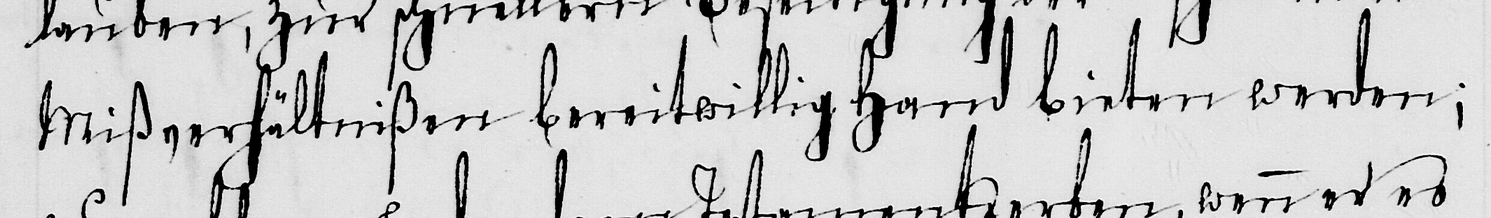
Mißverhältnißen bereitwillig Hand bieten werden;
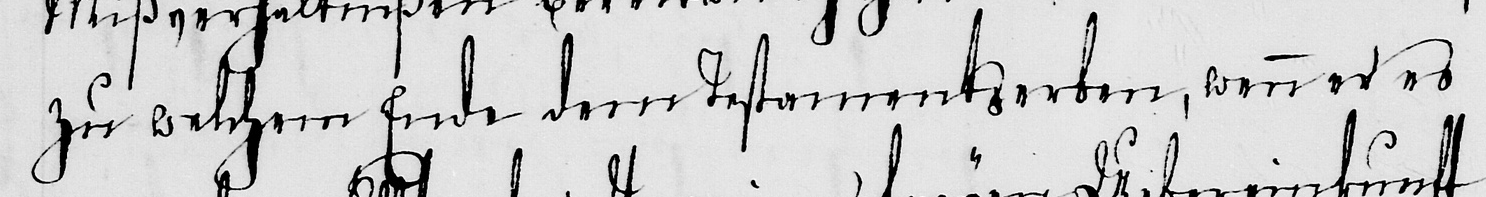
zu welchem Ende dem Testamentserben, wenn er es
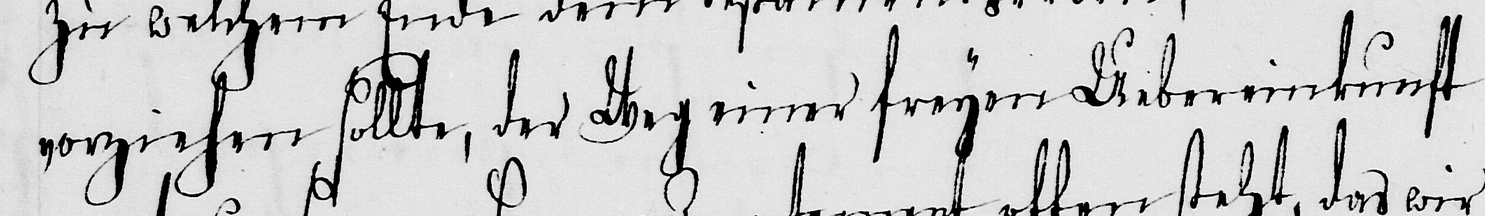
vorziehen sollte, der Weg einer freyen Uebereinkunft
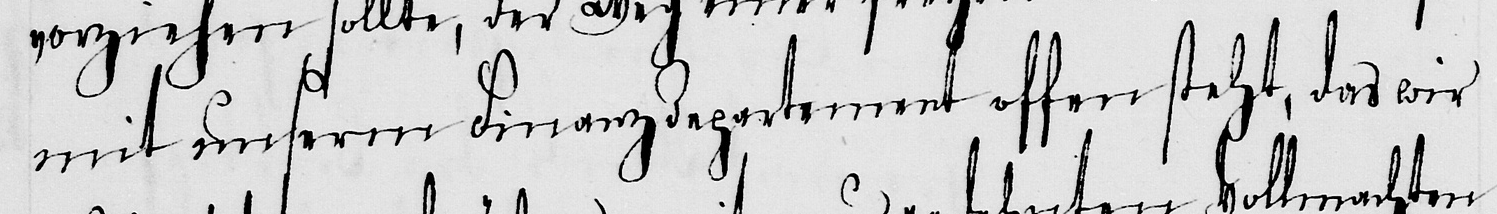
mit unserm Finanzdepartement offen steht, das wir
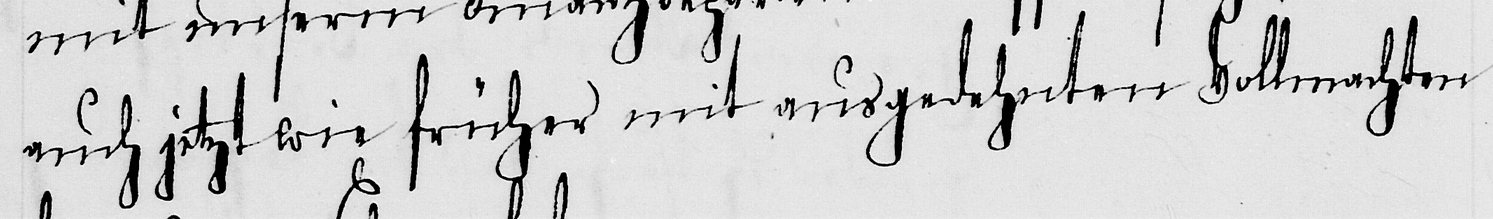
auch jetzt wie früher mit ausgedehnten Vollmachten
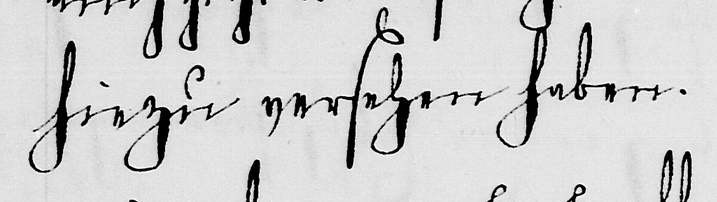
hiezu versehen haben.
